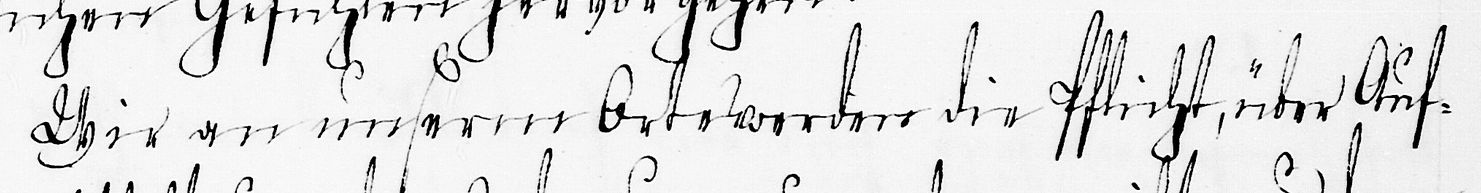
Wir an unserm Orte werden die Pflicht, über Auf¬
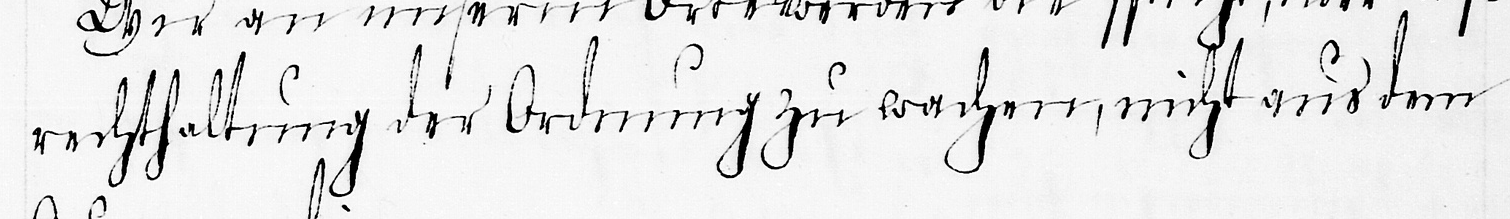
rechterhaltung der Ordnung zu wachen, nicht aus dem
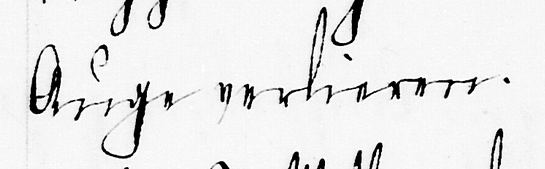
Auge verlieren.
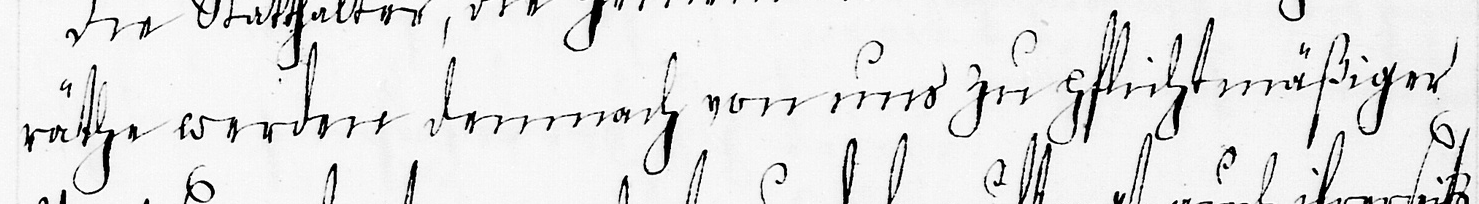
räthe werden demnach von uns zu pflichtmäßiger
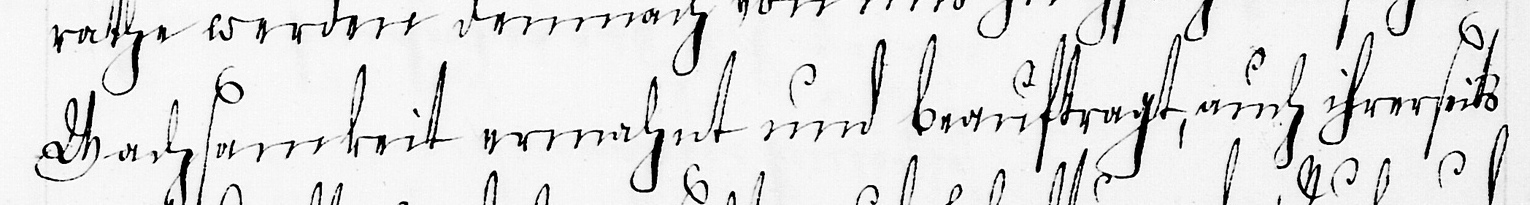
Wachsamkeit ermahnt und beauftragt, auch ihrersei¬
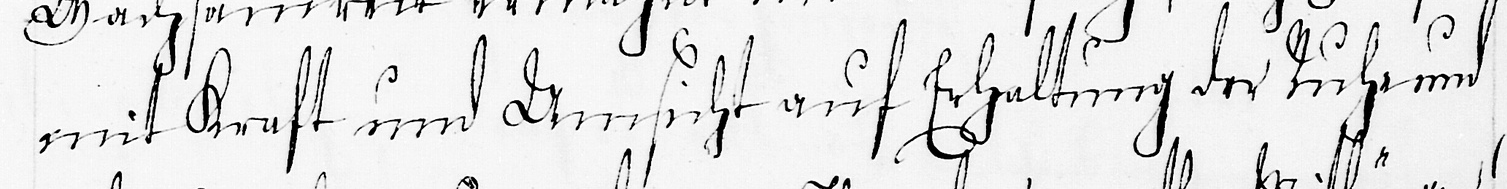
mit Kraft und Umsicht auf Erhaltung der Ruhe und
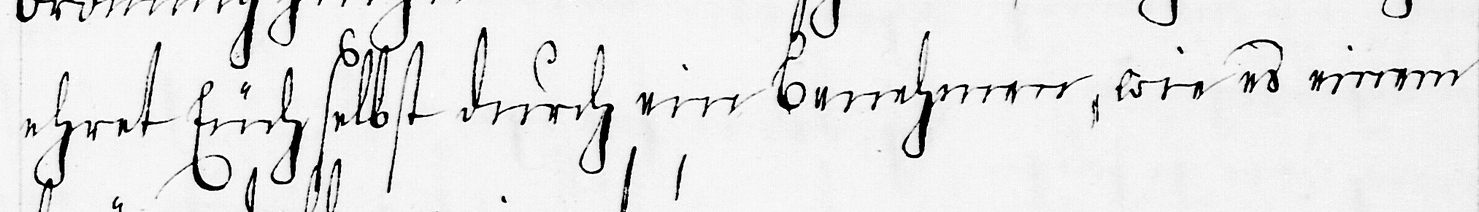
ehret Euch selbst durch ein Benehmen, wie es einem
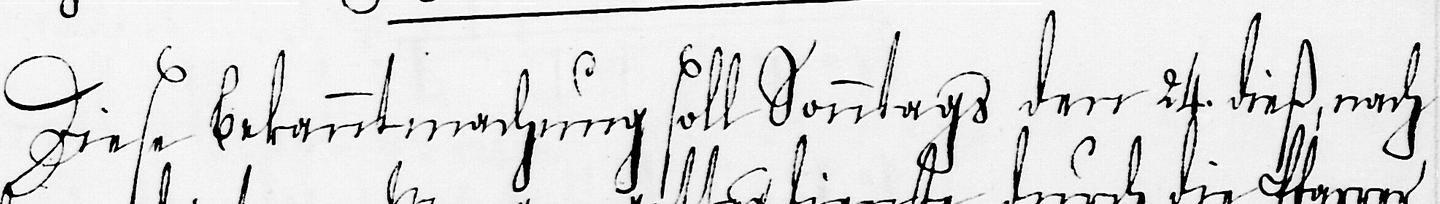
Diese Bekanntmachung soll Sonntags den 24. dieß, nach
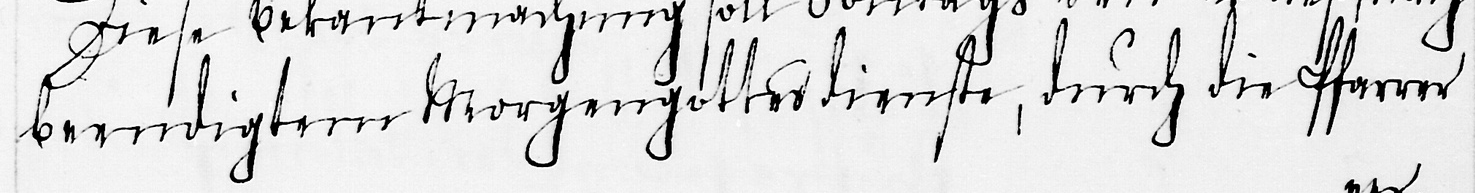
beendigtem Morgengottesdienste, durch die Pfarrer
